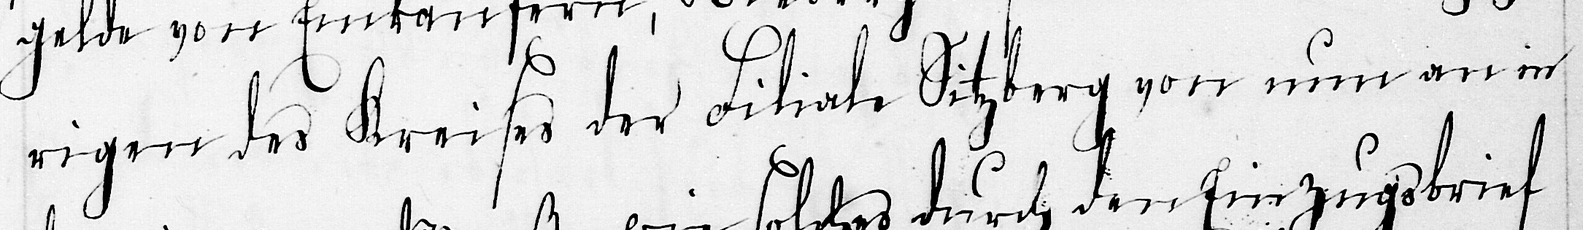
rigen des Kreises der Filiale Sitzberg von nun an in
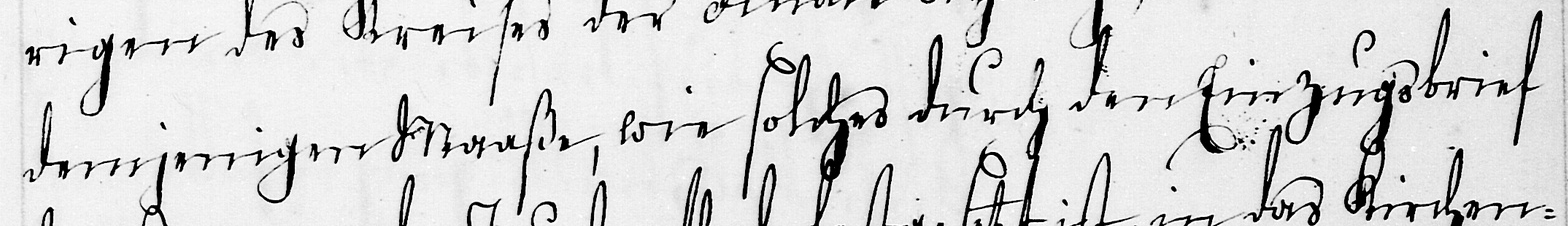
demjenigen Maaße, wie solches durch den Einzugsbrief
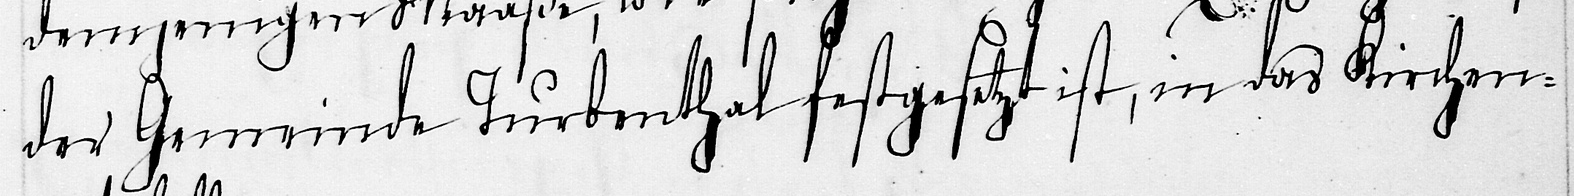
der Gemeinde Turbenthal festgesetzt ist, in das Kirchen¬
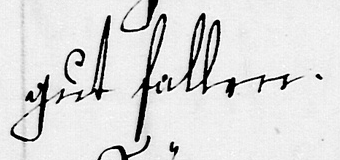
gut fallen.
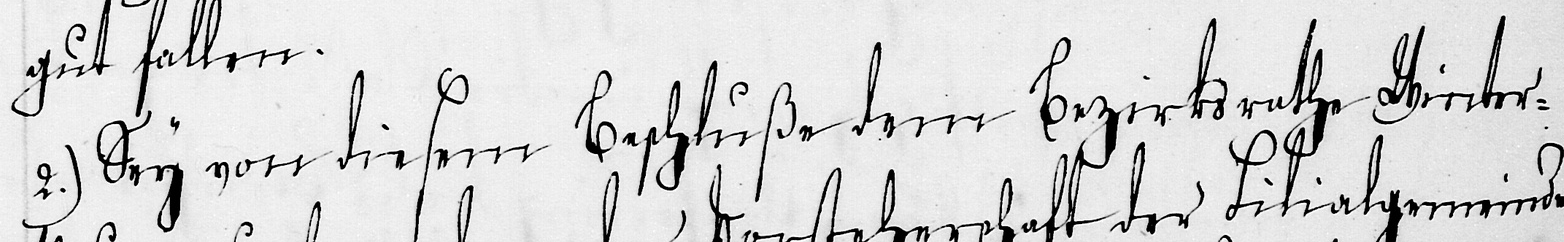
2.) Sey von diesem Beschluße dem Bezirksrathe Winter¬
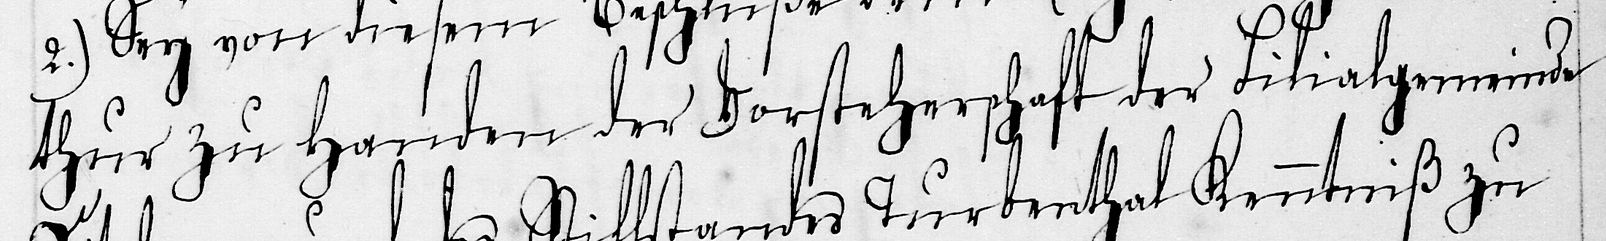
thur zu Handen der Vorsteherschaft der Filialgemeinde
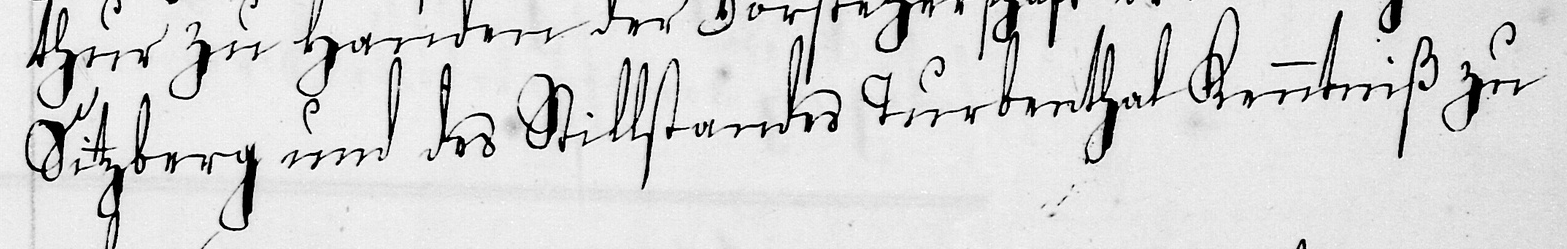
Sitzberg und des Stillstandes Turbenthal Kenntniß zu
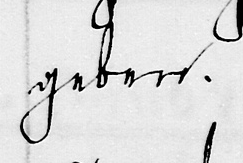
geben.
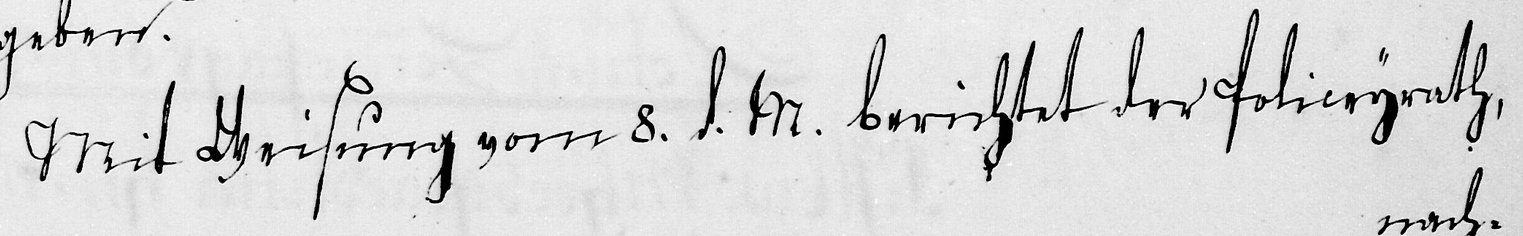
Mit Weisung vom 8. d. M. berichtet der Policeyrath,
